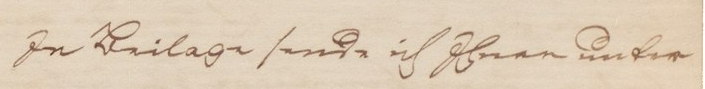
In Beilage sende ich Ihnen unter
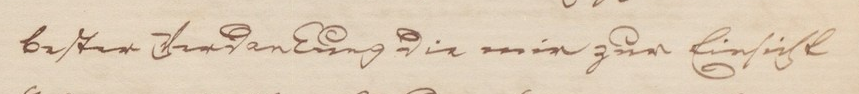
bester Verdankung die mir zur Einsicht
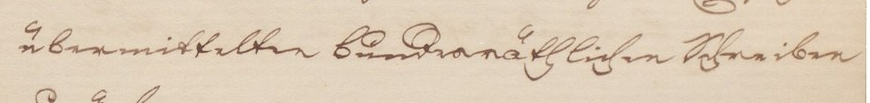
übermittelten bundesräthlichen Schreiben
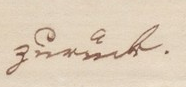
zurück.
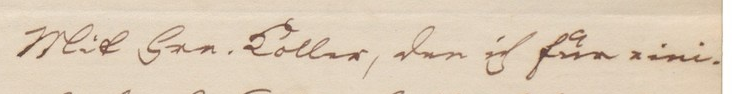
Mit Hrn. Koller, den ich für eini-
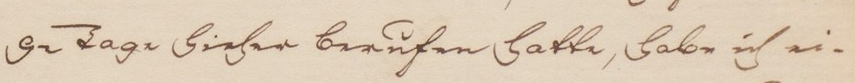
ge Tage hieher berufen hatte, habe ich ei-
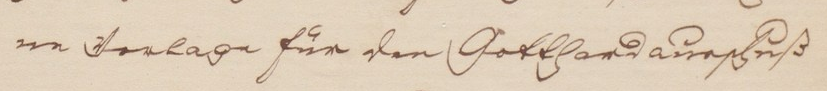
ne Vorlage für den Gotthardausschuß
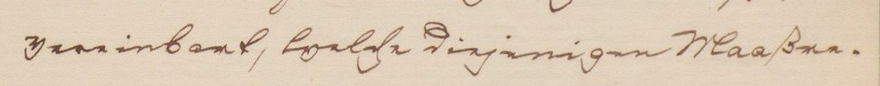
vereinbart, welche diejenigen Maaßre-
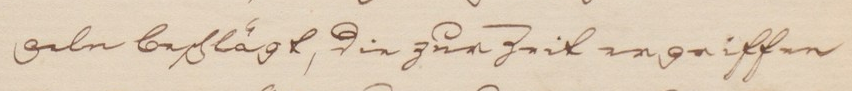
geln beschlägt, die zur Zeit ergriffen
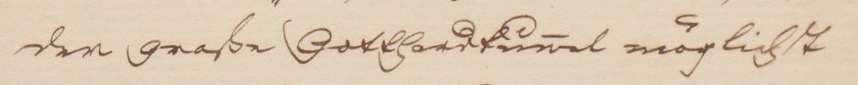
der große Gotthardtunnel möglichst
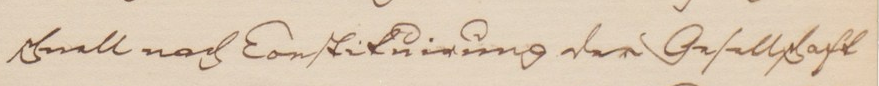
schnell nach Constituirung der Gesellschaft
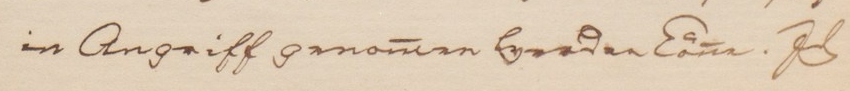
in Angriff genommen werden könne. Ich
